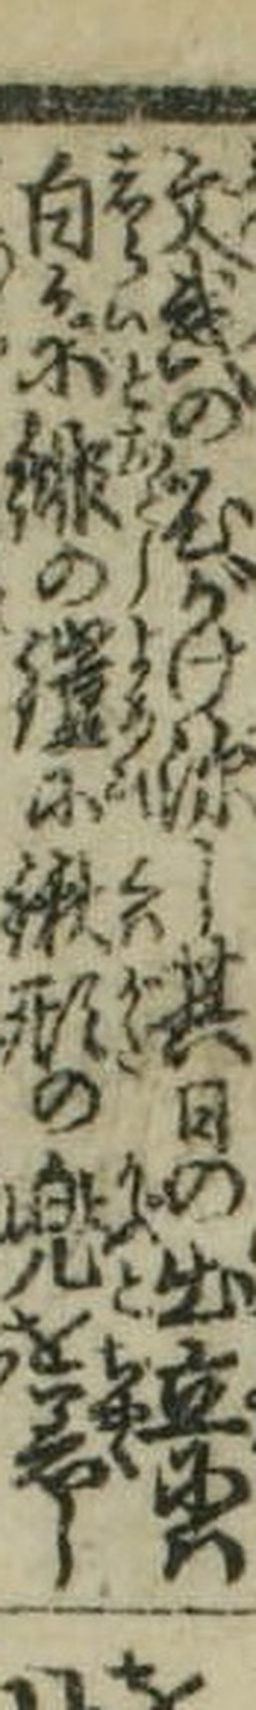白糸縅の鎧に鍬形の兜を着し
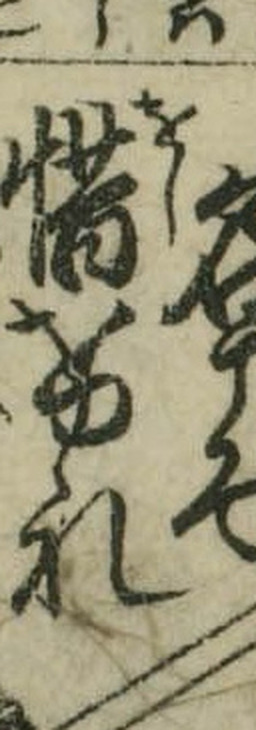惜けれ
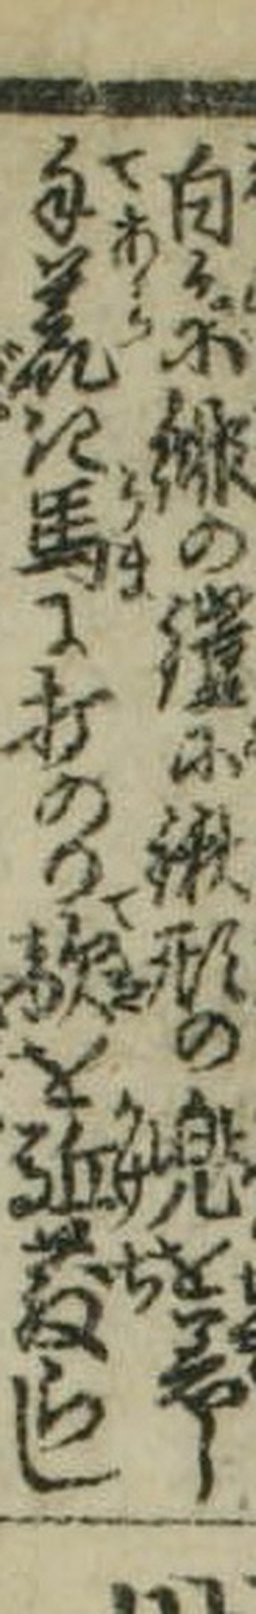手荒き馬に打のり敵を駈散らし
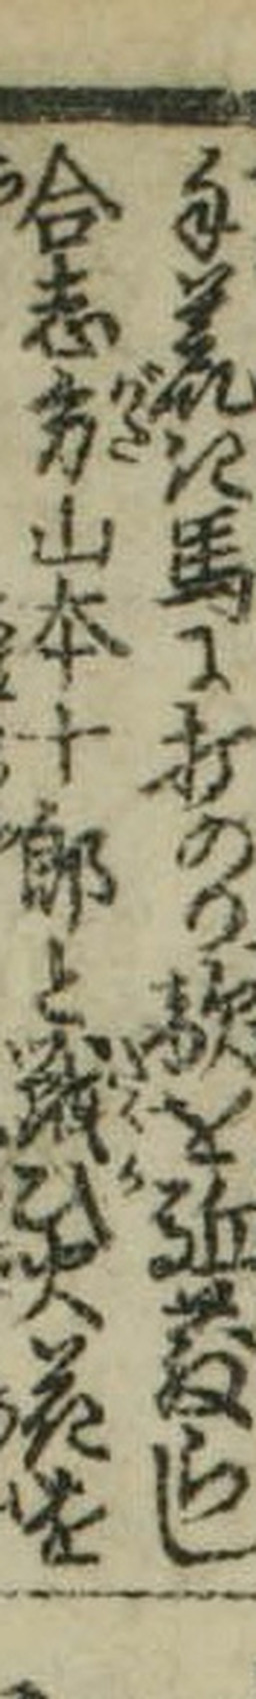合志方山本十郎と戦ひ火花を
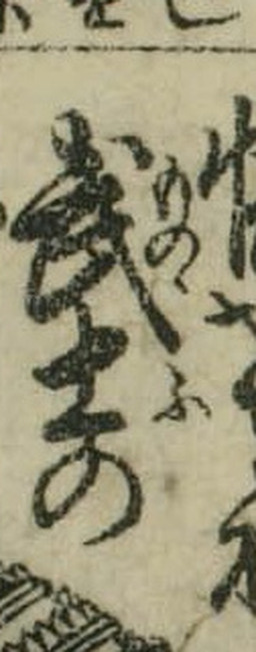武士の
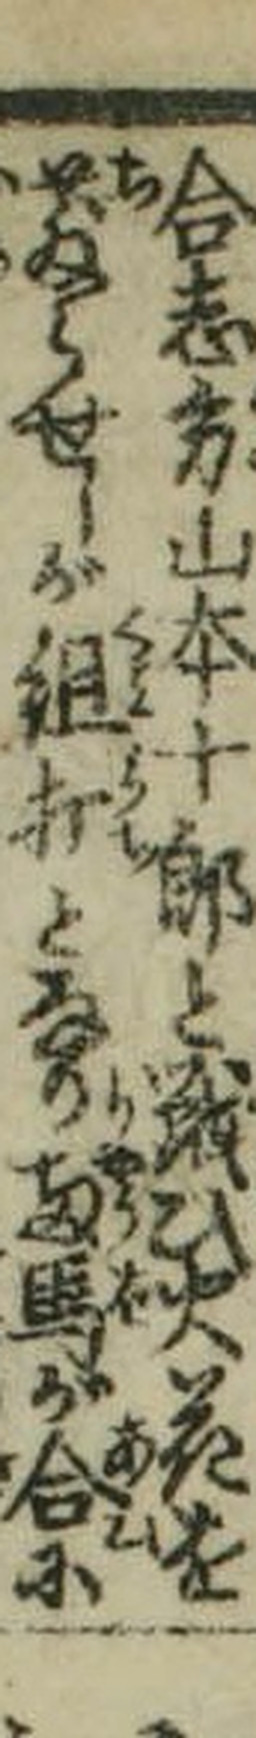散らせしが組打となり両馬が合に
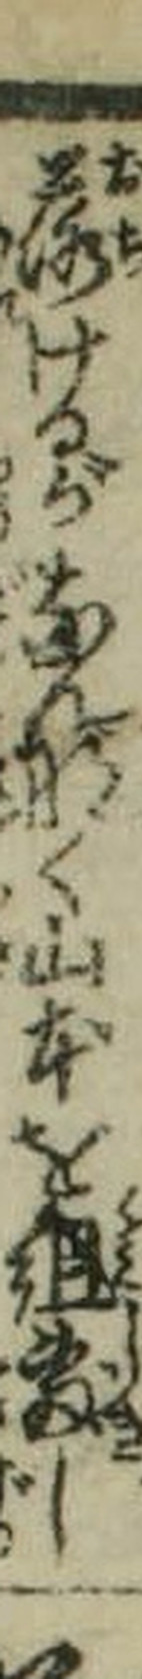落けるがなんなく山本を組敷し
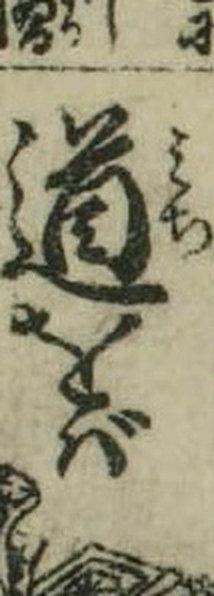道をば
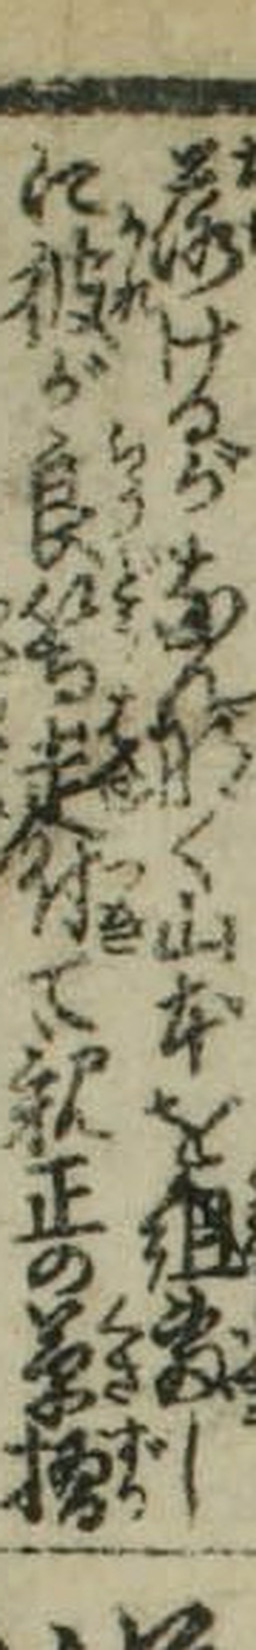に彼が良等走付て親正の草摺
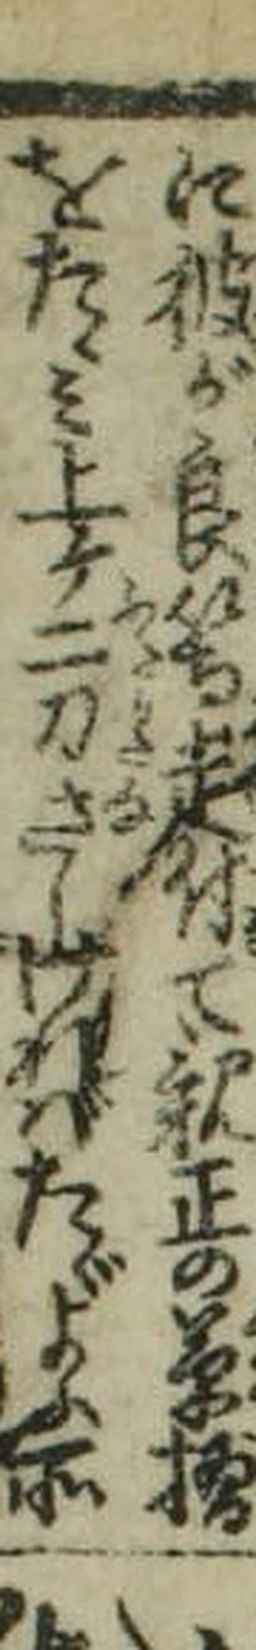をたゝみ上け二刀さしければたゞよふ所
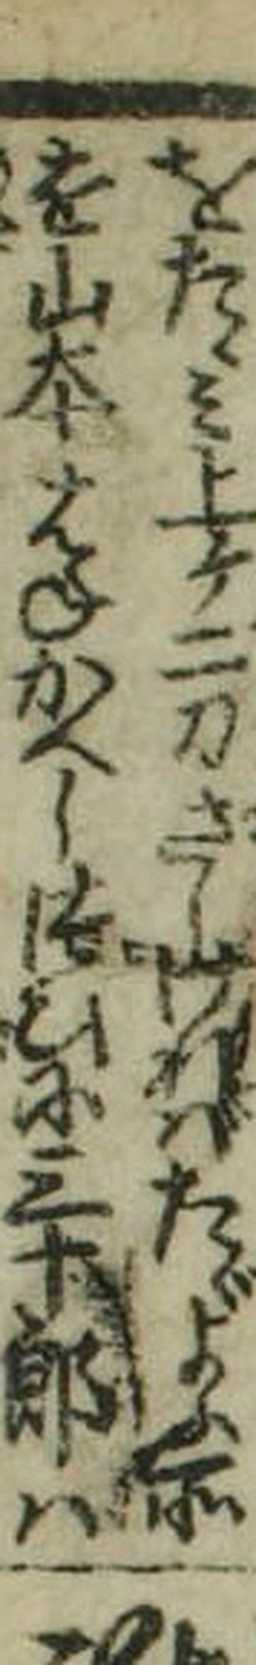を山本はねかへしつひに三十郎は
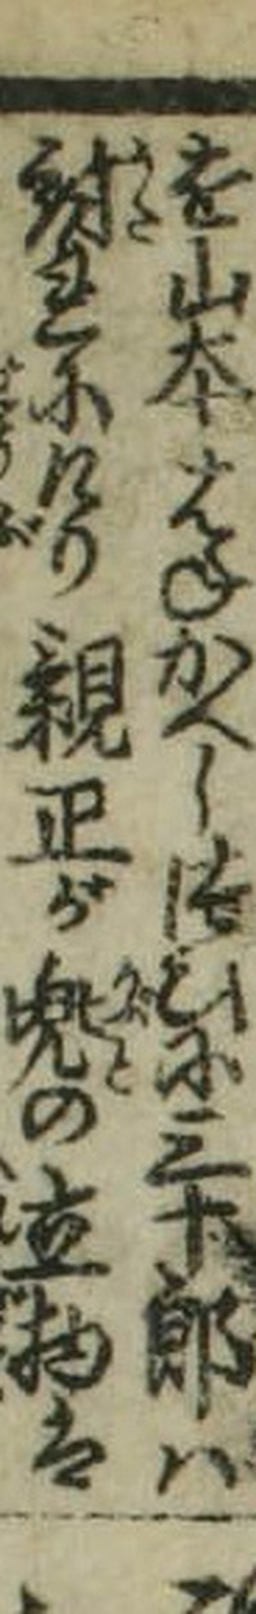討れにけり親正が兜の立物は
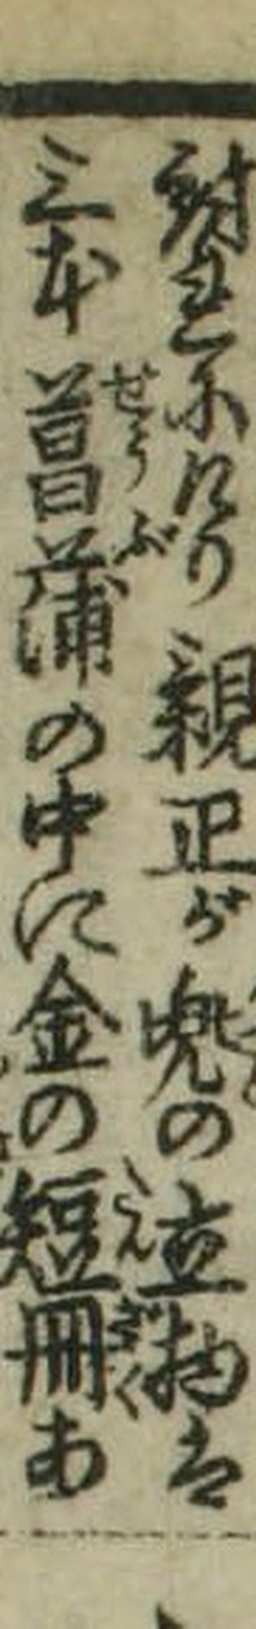三本菖蒲の中に金の短冊あ
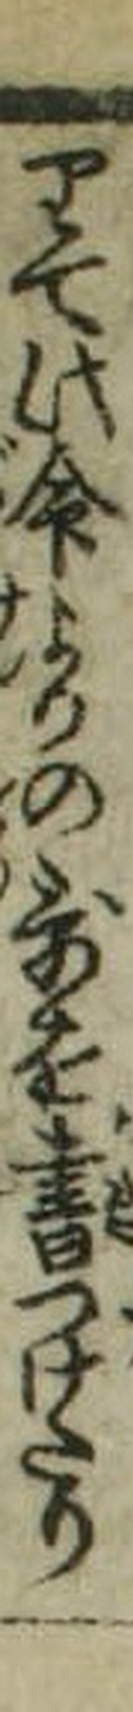りて此命よりの歌を書つけたり
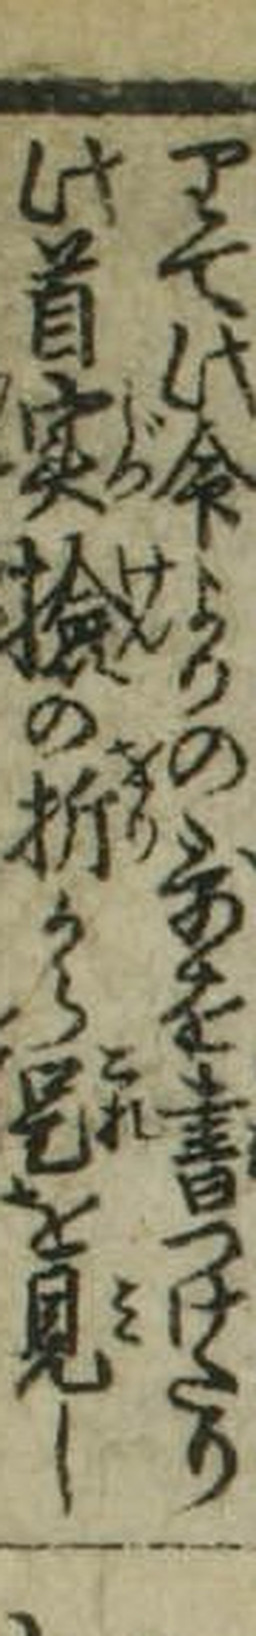此首実検の折から是を見し
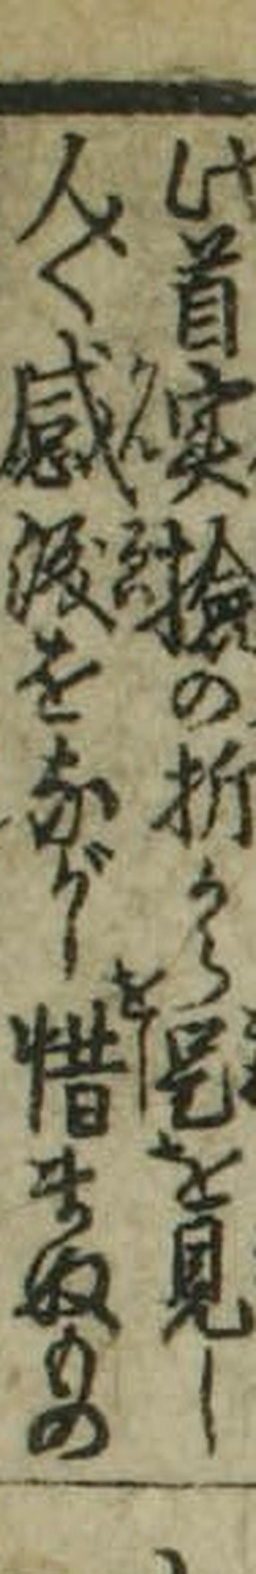人〳〵感涙をながし惜まぬもの
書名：續英雄百人一首
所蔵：東京学芸大学附属図書館
